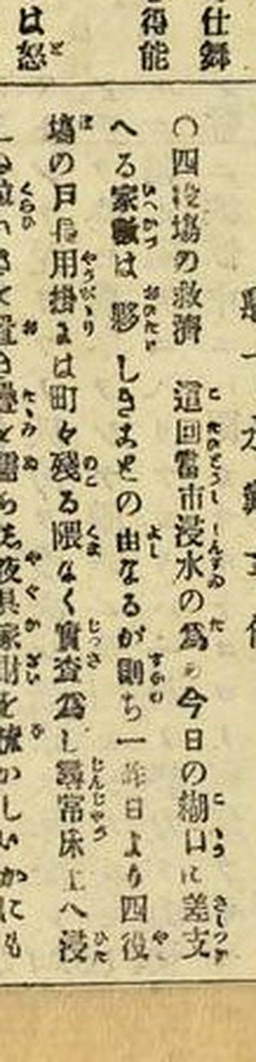へる家數は夥しきことの由なるが則ち一昨日より四役
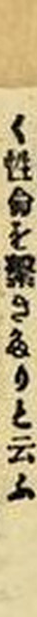く性命を繋きたりと云ふ
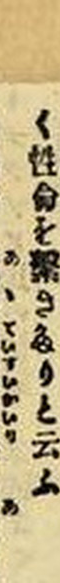く性命を繋きたりと云ふ
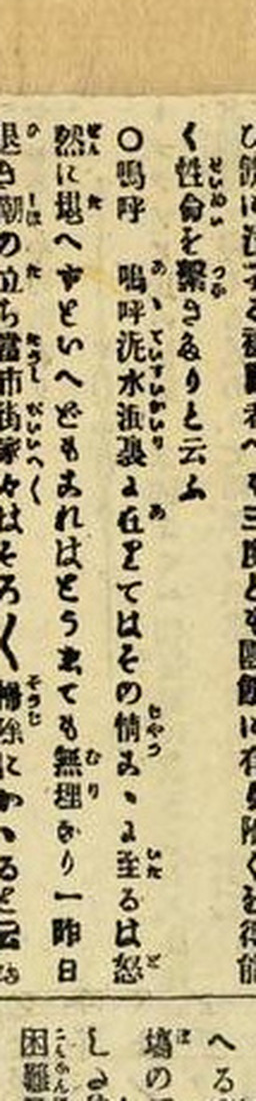○嗚呼嗚呼泥水海裏に在りてはその情こゝに至るは怒
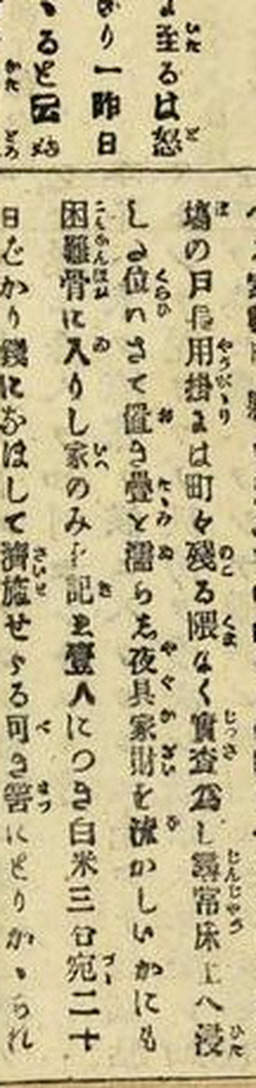した位はさて置き疂を濡らし夜具家財を流かしいかにも
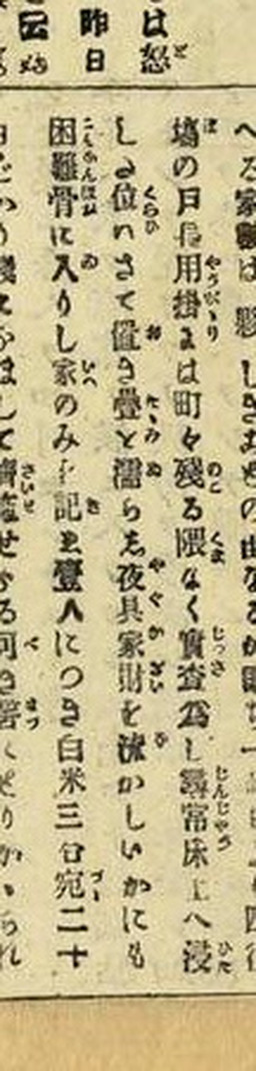した位はさて置き疂を濡らし夜具家財を流かしいかにも
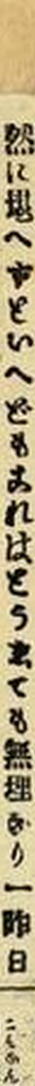然に堪へずといへどもこれはとうしても無理なり一昨日
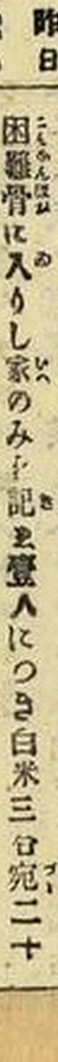困難骨に入りし家のみを記し壹人につき白米三合宛二十
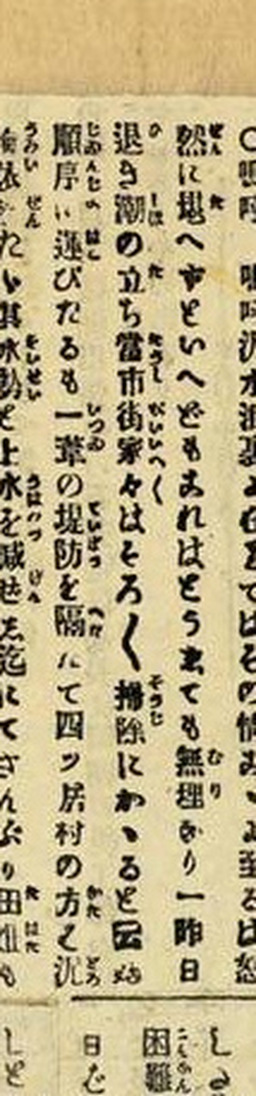退き潮の立ち當市街家々はそろ〳〵掃除にかゝると云ふ
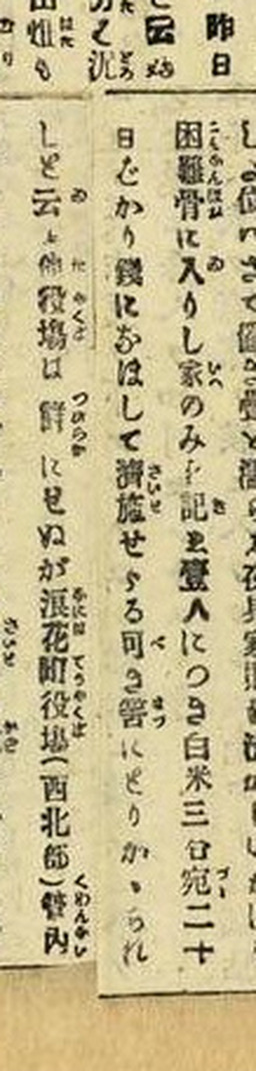日ばかり錢になほして濟施せらる可き筈にとりかゝられ
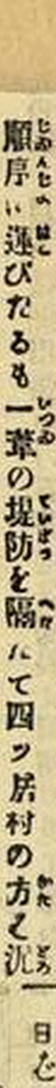順序に運びたるも一葦の堤防を隔たて四ッ居村の方は泥
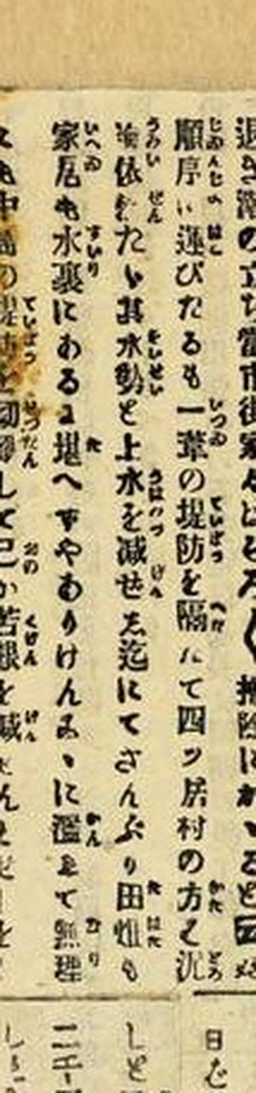海依然たゞ其水勢と上水を減せし迄にてざんぶり田畑も
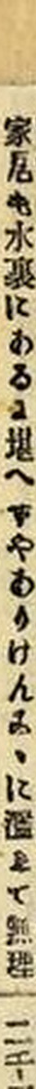家居も水裏にあるに堪へずやありけんこゝに濫して無理
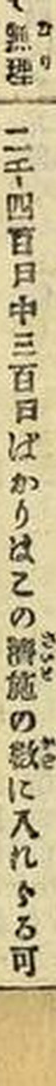二千四百戸中三百戸ばかりはこの濟施の數に入れらる可
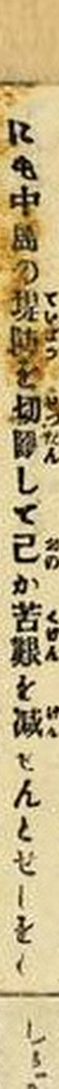にも中島の堤防を切断して己か苦艱を減せんとせしをこ
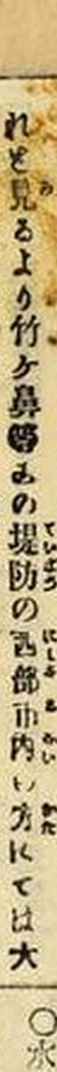れと見るより竹ヶ鼻等この堤防の西部市内の方にては大
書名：温古集 五巻
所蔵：福井県文書館 Fukui Prefectural Archives
